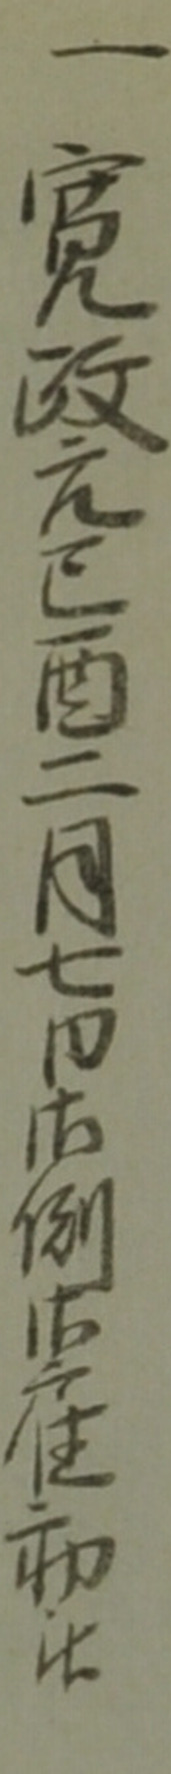一寛政元己酉二月七日御側御雇勤被
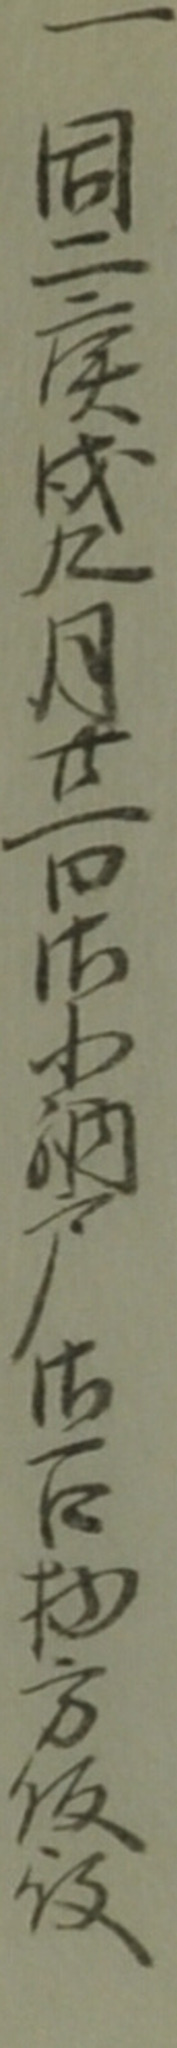一同二庚戌九月廿一日御小納戸御召物方仮役
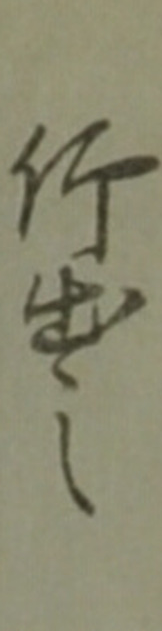仰出之
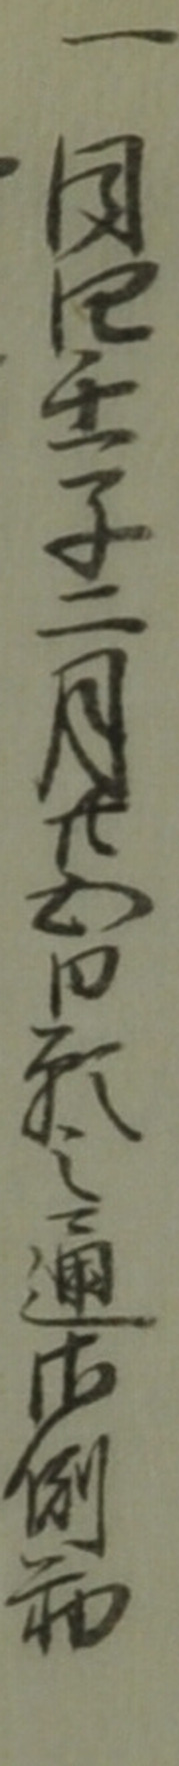一同四壬子二月廿五日願之通御側勤
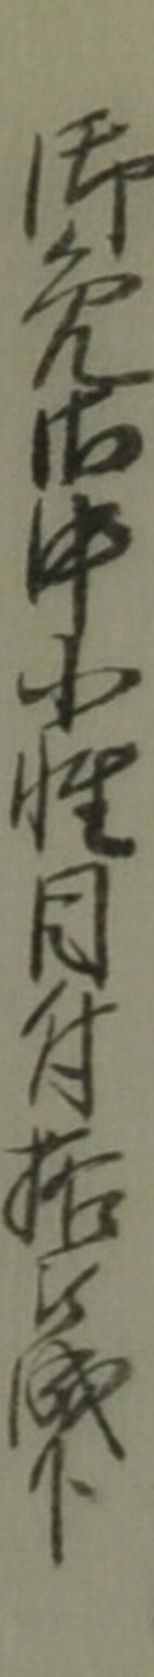御免御中小性目付格被成下
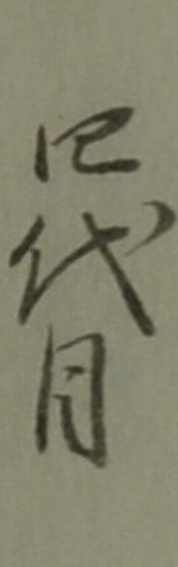四代目
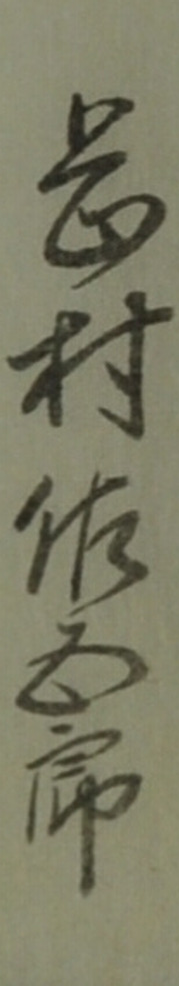岡村佐五郎
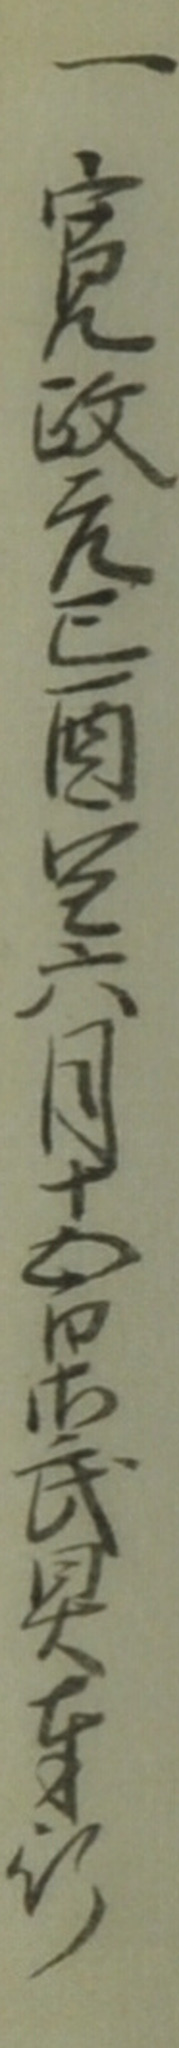一寛政元己酉閏六月十五日御武具奉行

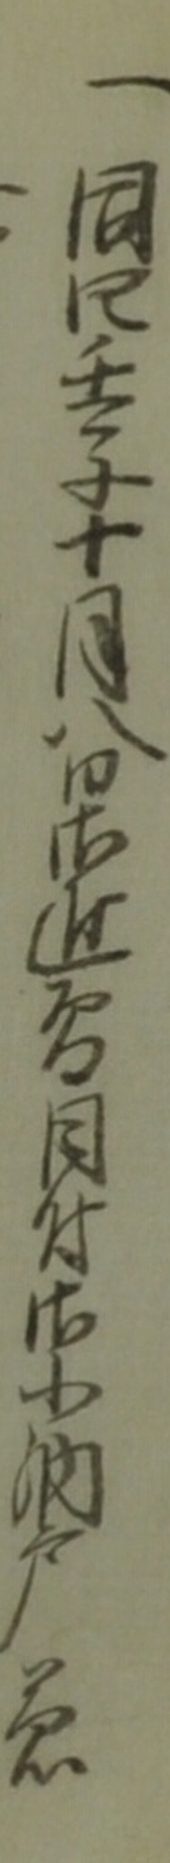一同四壬子十月八日御近習目付御小納戸兼
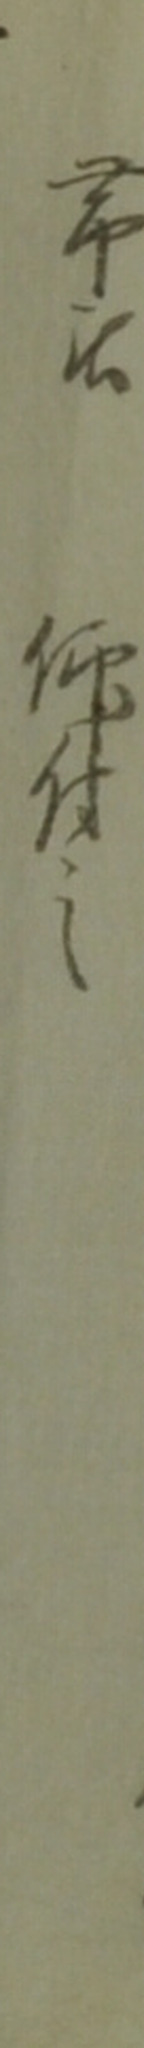帯被仰付之
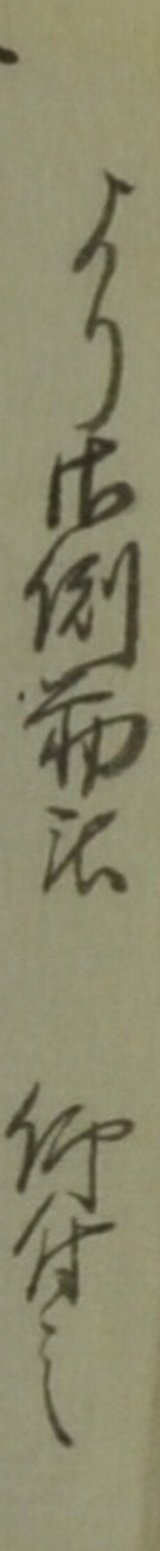より御側勤被仰付之
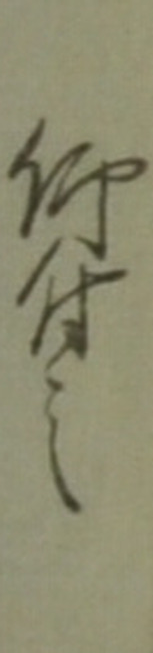仰付之
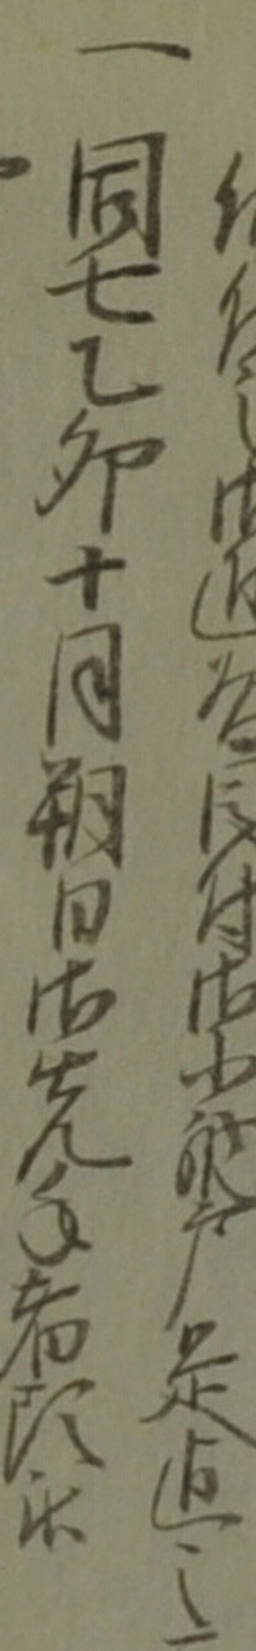一同七乙卯十月朔日御先手者頭被
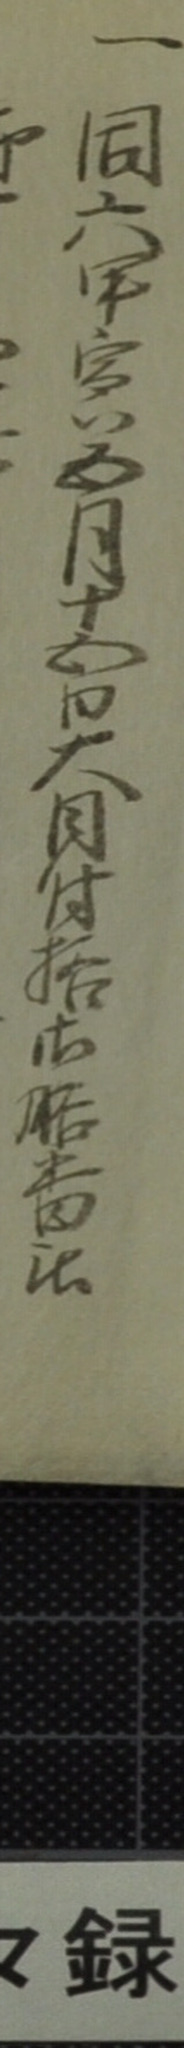一同六甲寅五月十五日大目付格御膳番被
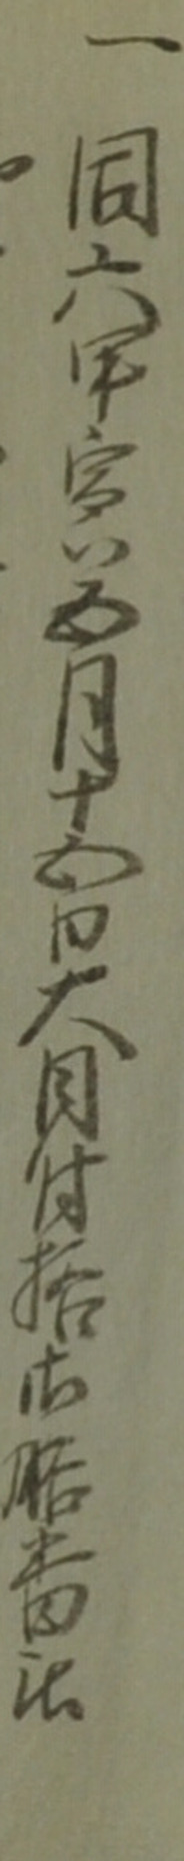一同六甲寅五月十五日大目付格御膳番被
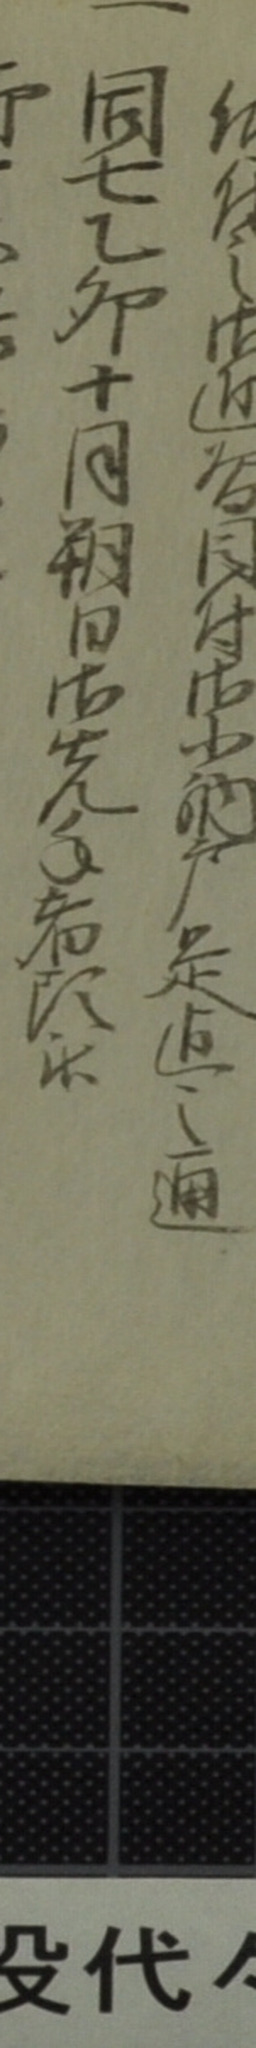一同七乙卯十月朔日御先手者頭被
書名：諸御役代々録（五）
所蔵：伊那市立高遠町図書館・合同会社AMANE
